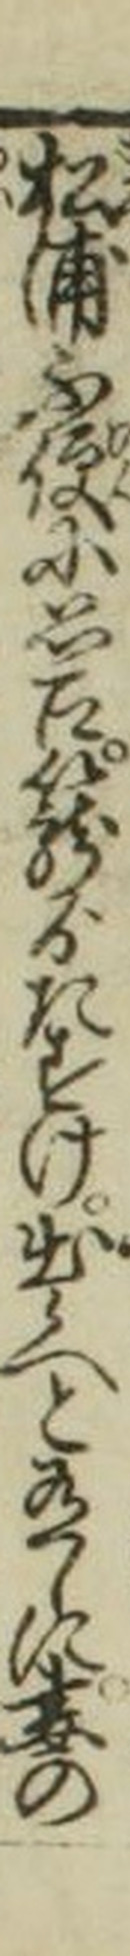松浦不便に思召。籠よりたすけ。出候へと有しに。妻の
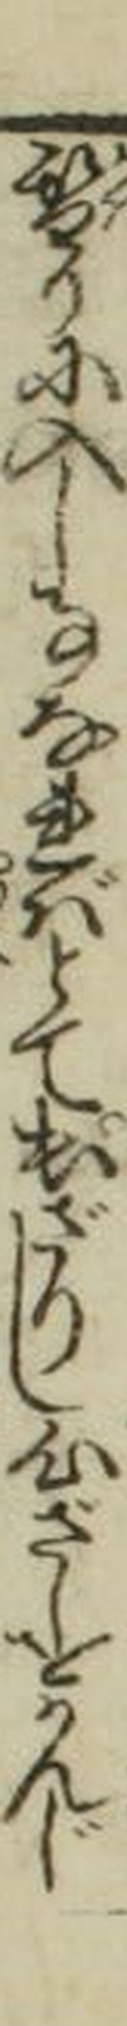替りに入し事なればとて。出ざりし心ざしをかんじ
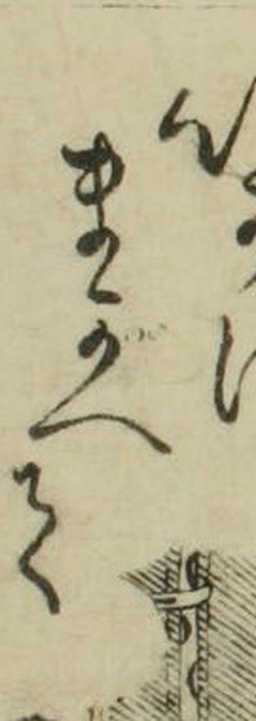まがへて
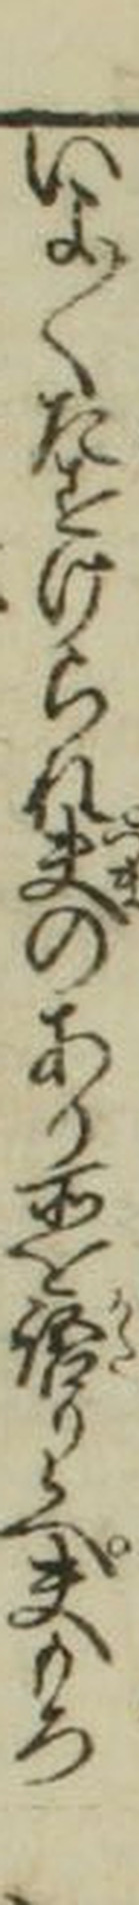いよ〳〵たすけられ。夫のあり所を語り候へ。夫もろ
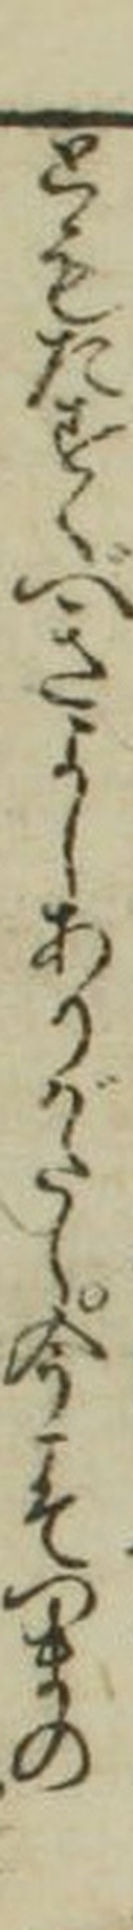ともたすくべきよしありがたし。今こそつまの
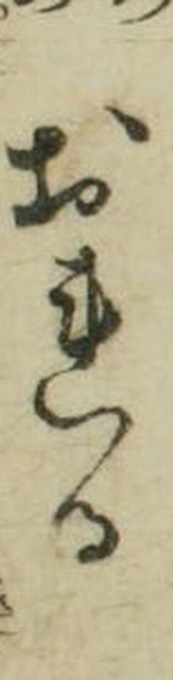おれる
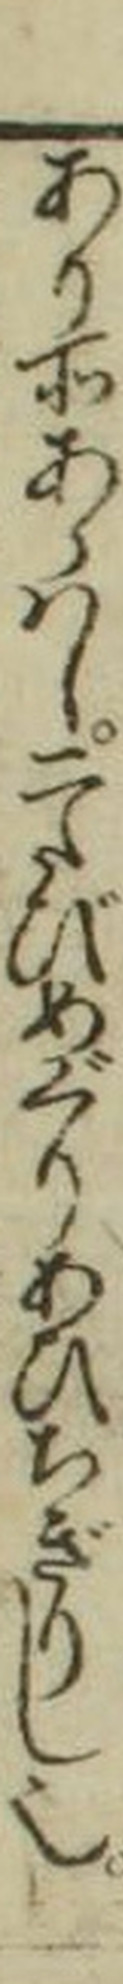あり所あらはし。二たびめぐりあひちぎりし也。
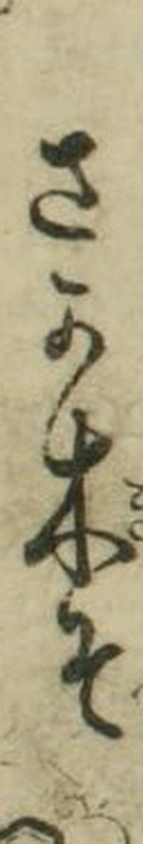さか木ぞ
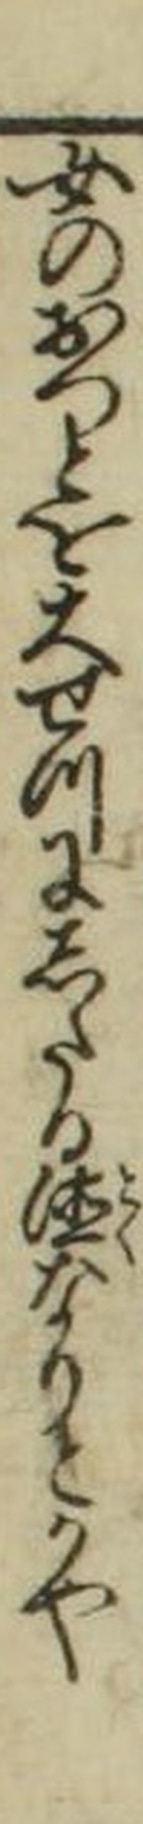女のおつとを大せつにしたる徳なりとかや

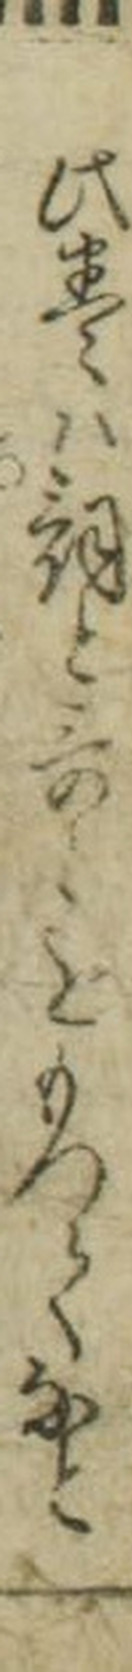此巻は詞と哥々をもつてなと
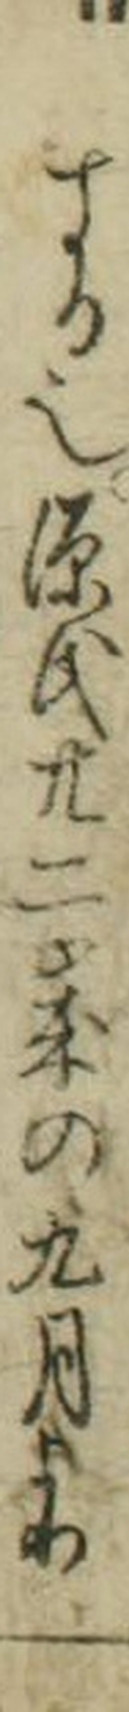する也。源氏廿二歳の九月より
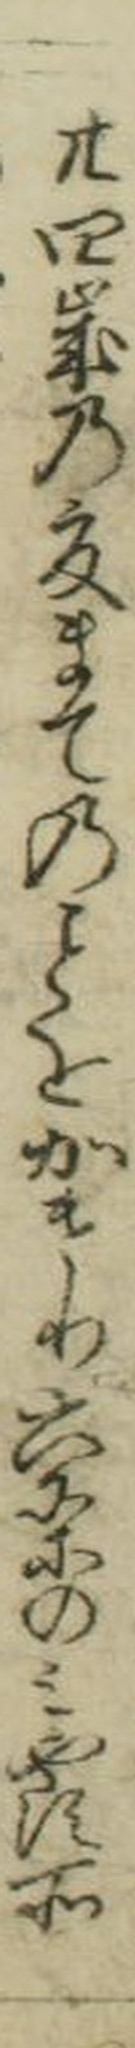廿四歳の夏まてのことをかけり。六条のみやす所
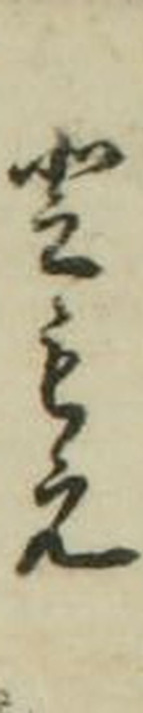ともえ
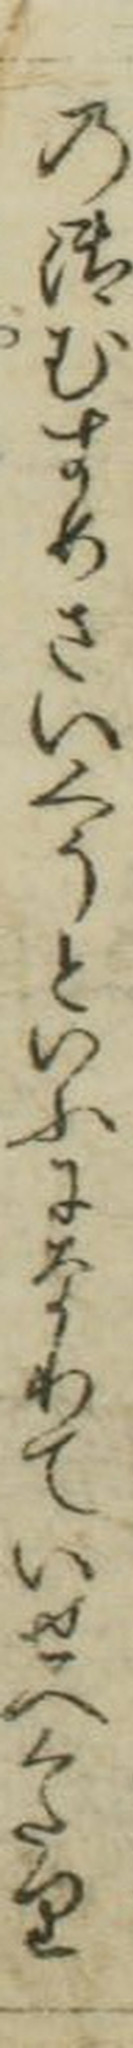の御むすめさいくうといふになりていせへくたり
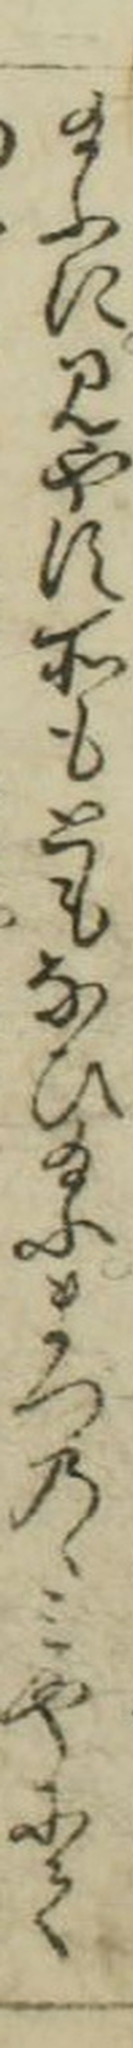給ふに。みやす所もともなひ給ふ。まつのゝみやにて
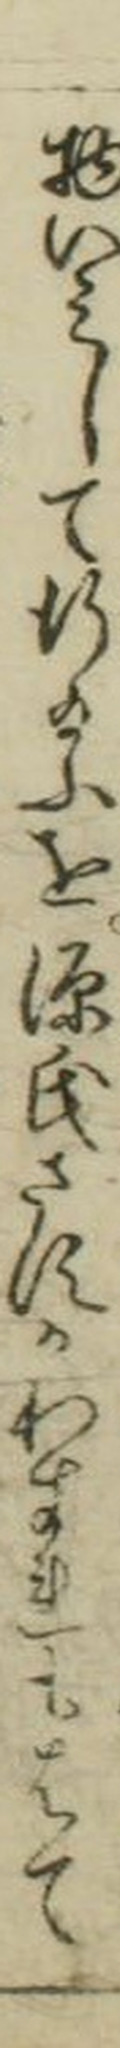物いみして行給ふを。源氏さすかわすれもはて
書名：女源氏教訓鑑
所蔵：東京学芸大学附属図書館
